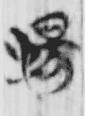湯
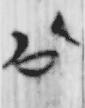公
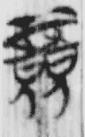競
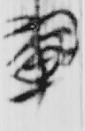軍
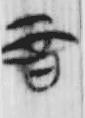言
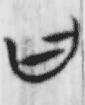曰
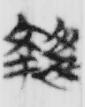執
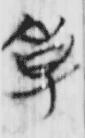事
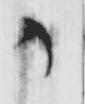人
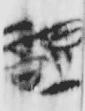○（屬）
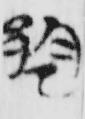陰
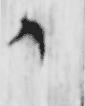人
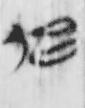宣
